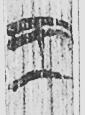王
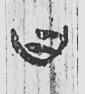曰
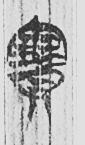賽
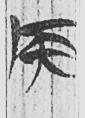侯
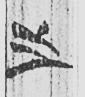之
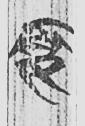妻
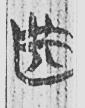甚
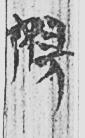{女𡵂}
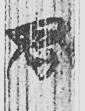君
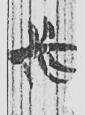必
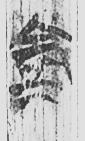命
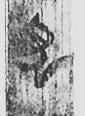見
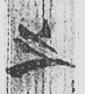之
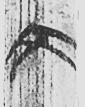文
